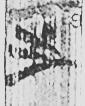之
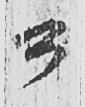乃
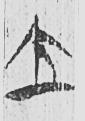立
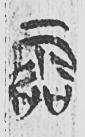霝
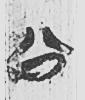公
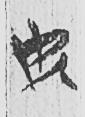𡚦
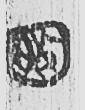{囗爿歺}
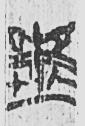襄
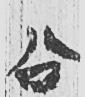公
